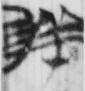牂
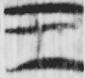王
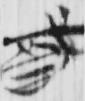戠
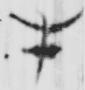牛
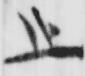之
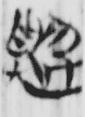○（舉）
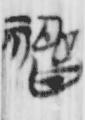禱
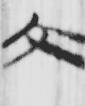文
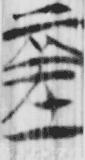坪（平）
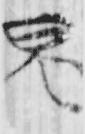○（夜）
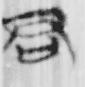君
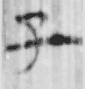子
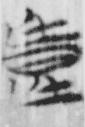良
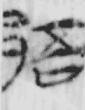郚
